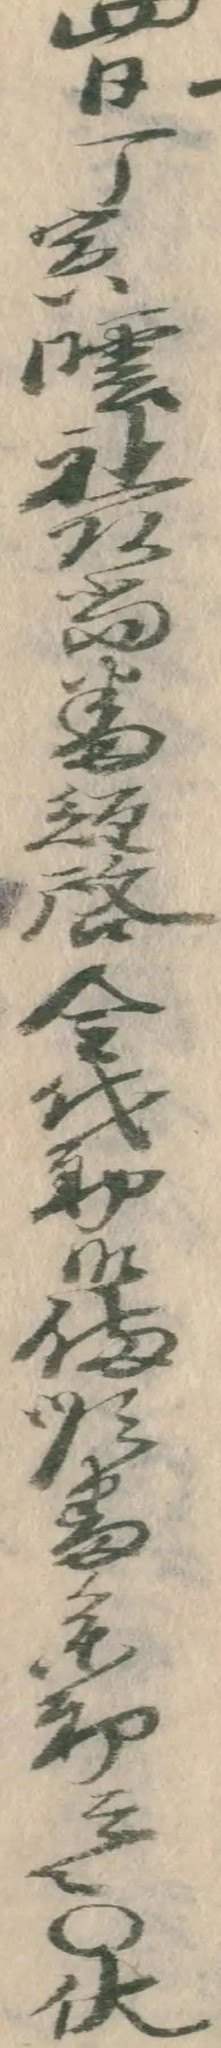四日丁寅曇社頭當番経啓令代勤御備順番参勤云々○伏
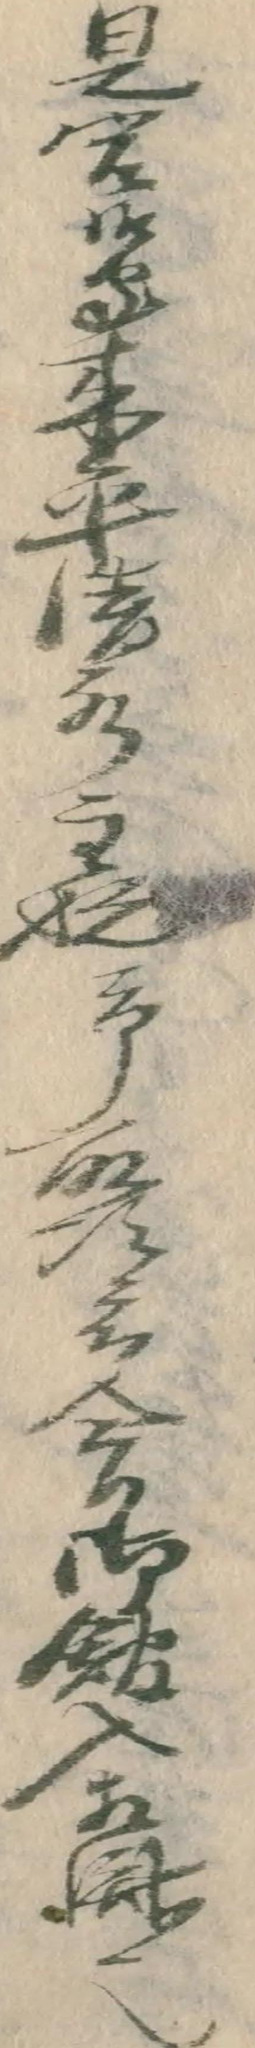見宮御家来平清水主税予取次ニ而今御館入相済也
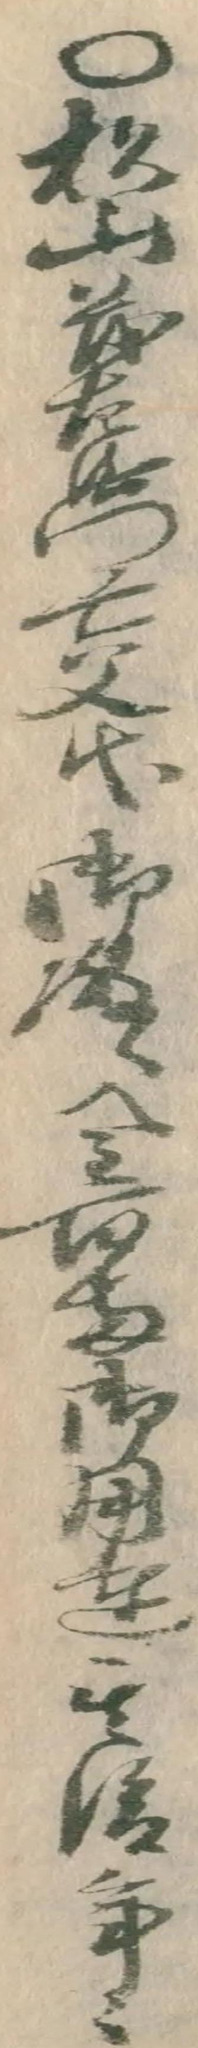○杦山茂左衛門亡父代御殿へ金百両御用達其後年々

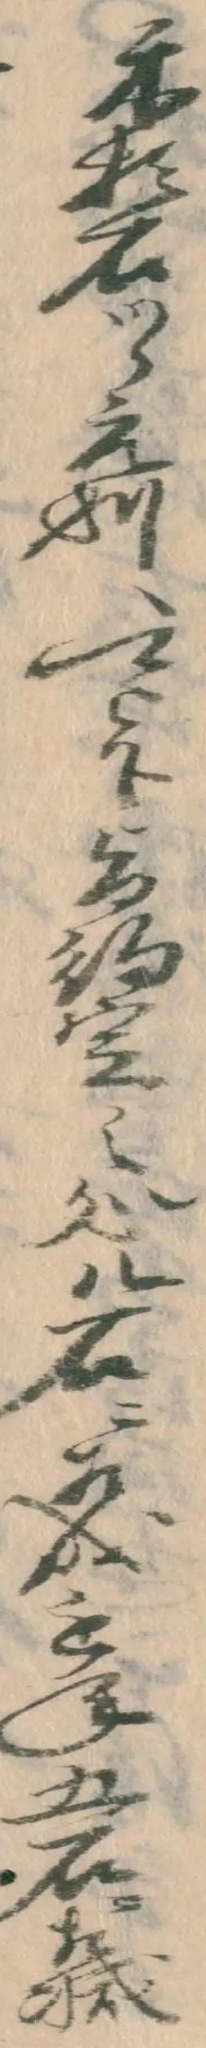米拾石ツヽ元利へ可被下旨約定也処八石ニ相成近年五石ニ相減
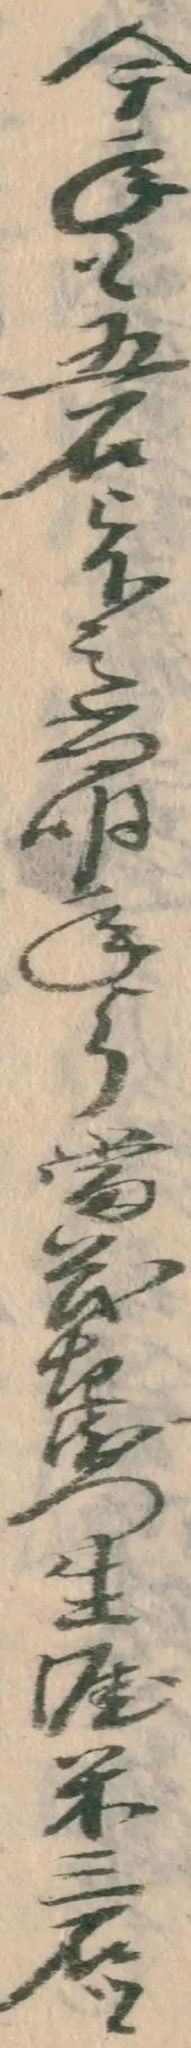今年も五石被下之尚明年より當茂左衛門生涯米三石ツヽ
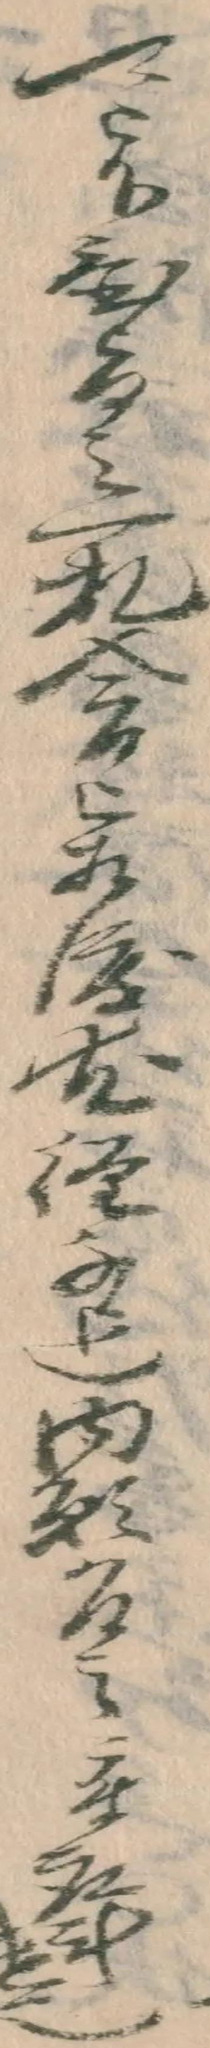可被下置旨之一札今日被相渡尤経千迄内願有之ニ付取斗遣也
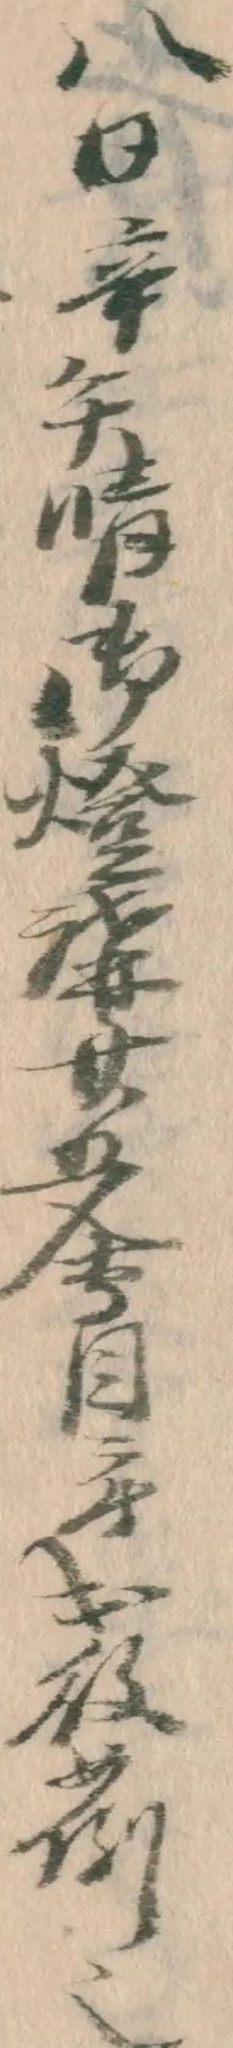八日辛午時御燈講廿五會目ニ付出役如例也
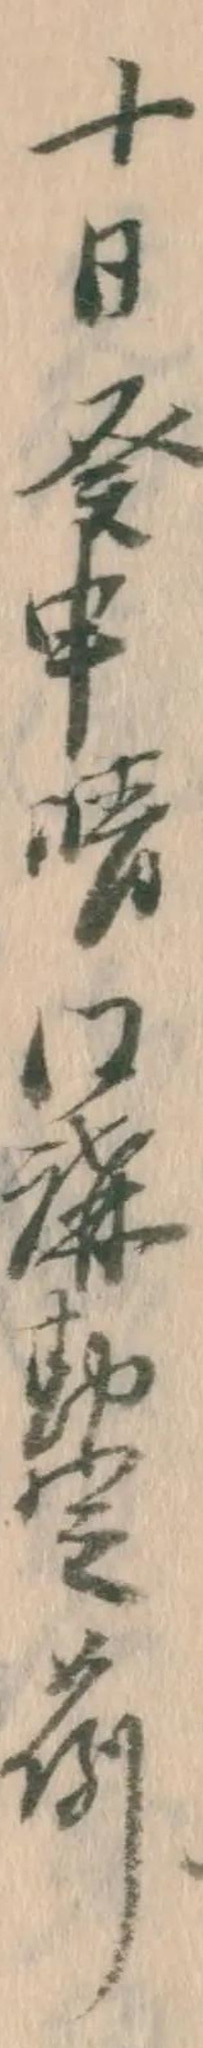十日癸申晴同講勘定如例
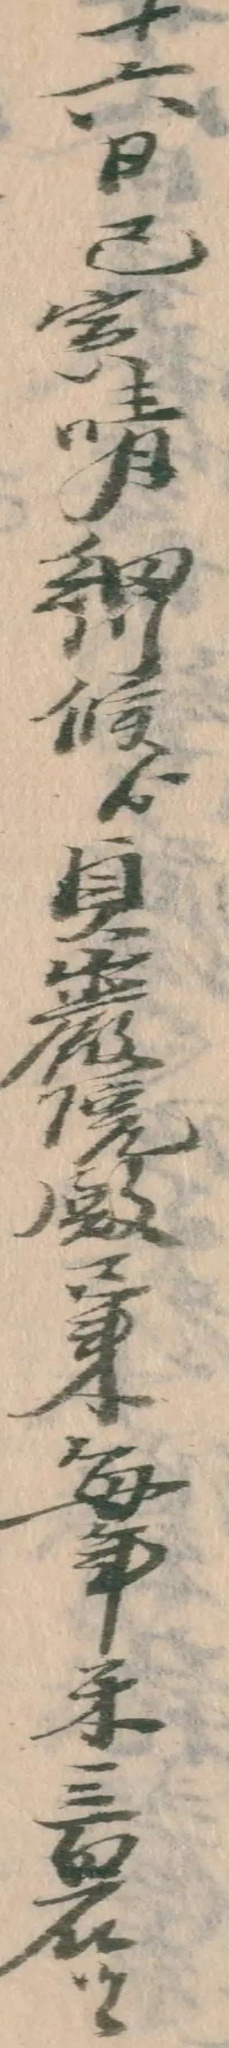十六日己寅晴細川侯ゟ貞厳院殿已来毎年来三百石ツヽ
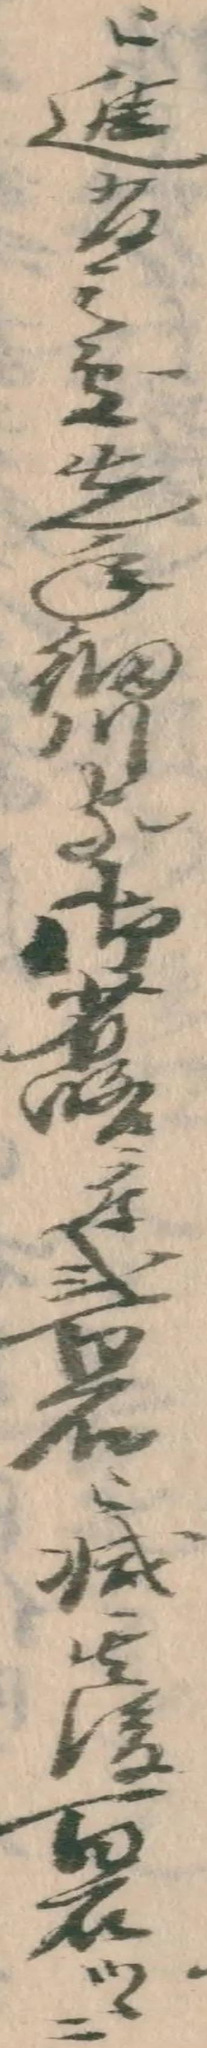被進有之處先年細川家御省略ニ付弐百石被減其後百石ツヽニ
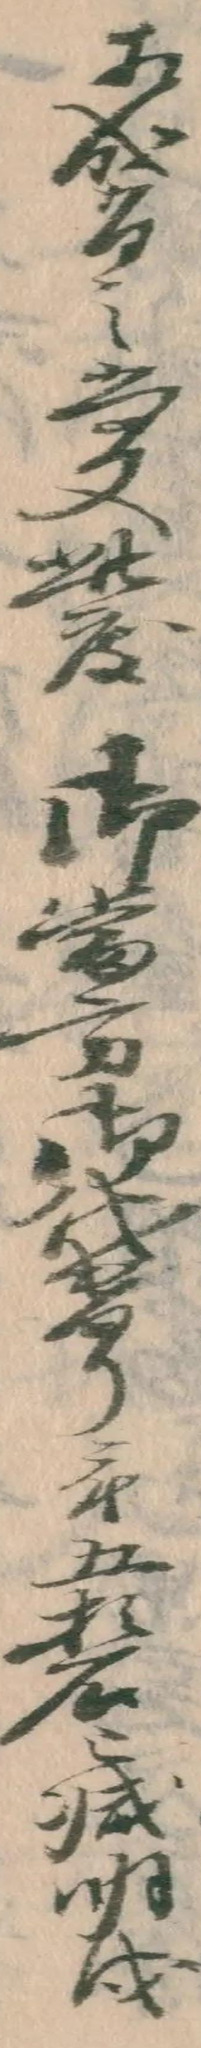相成有之尚又此度御當方御代替リニ付五拾石被減明戌
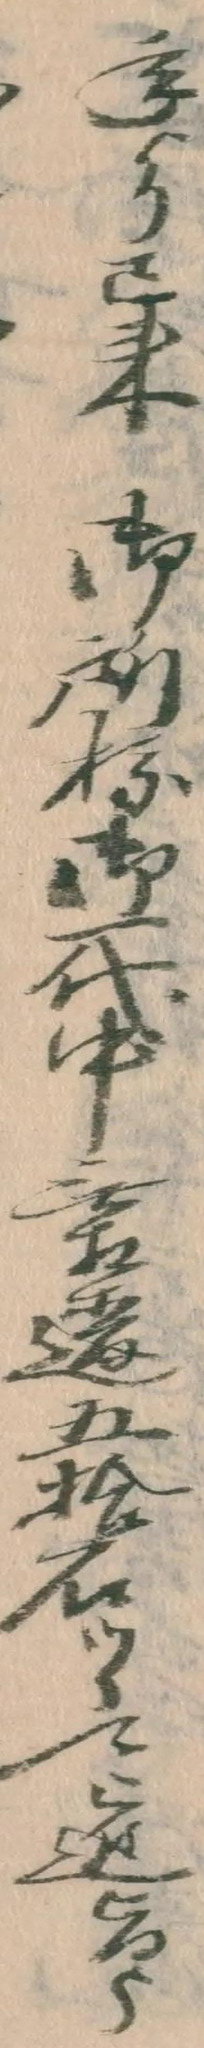年より已来御所様御一代中無相違五拾石ツヽ可被進旨申
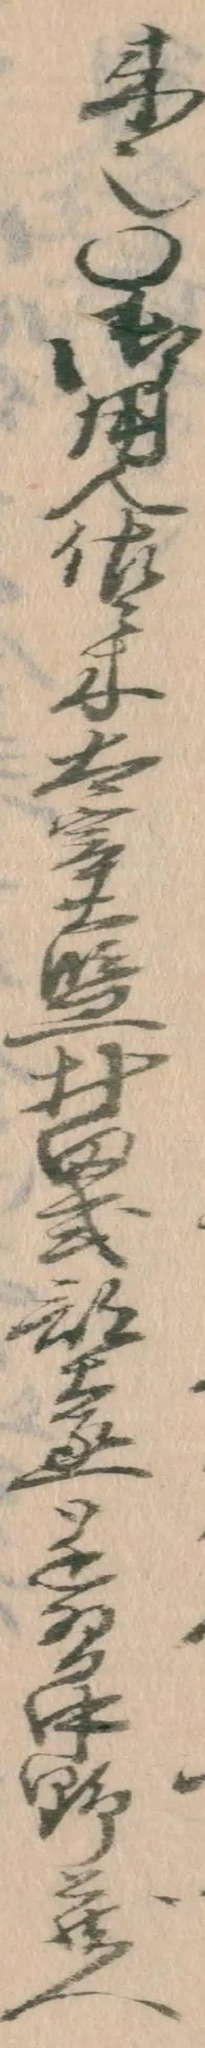来也○御用人佐々木太宰大監村田式部大丞御近習中野蔵人
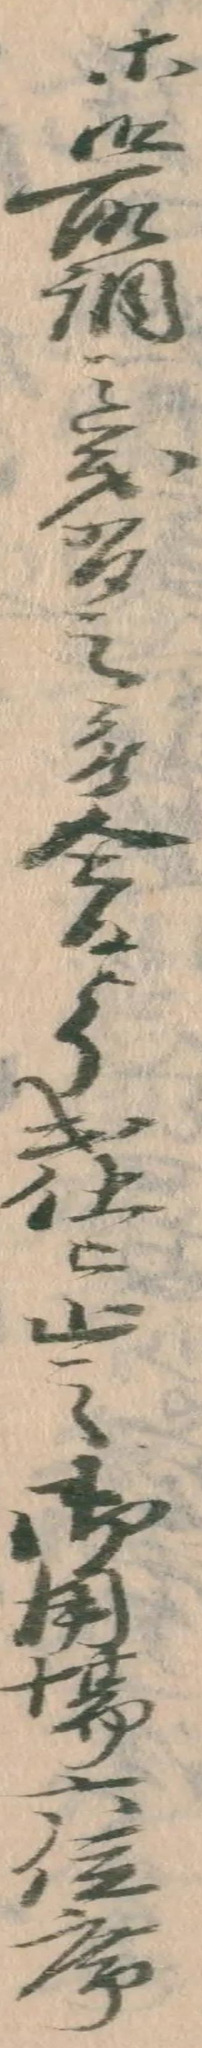等御取調之義有之ニ付今日より出仕被止之御用場六位席
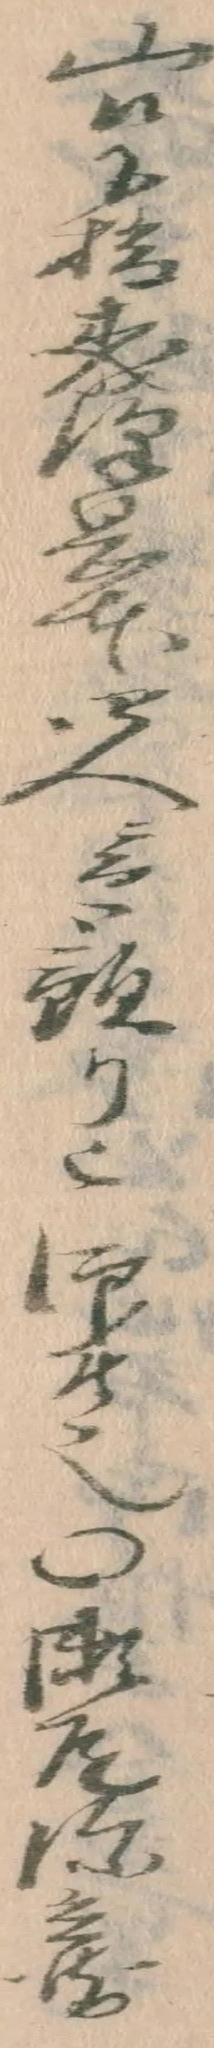山口下橋森沢岡本四人ニ而御預り被仰付也○瀬尾弥兵衛
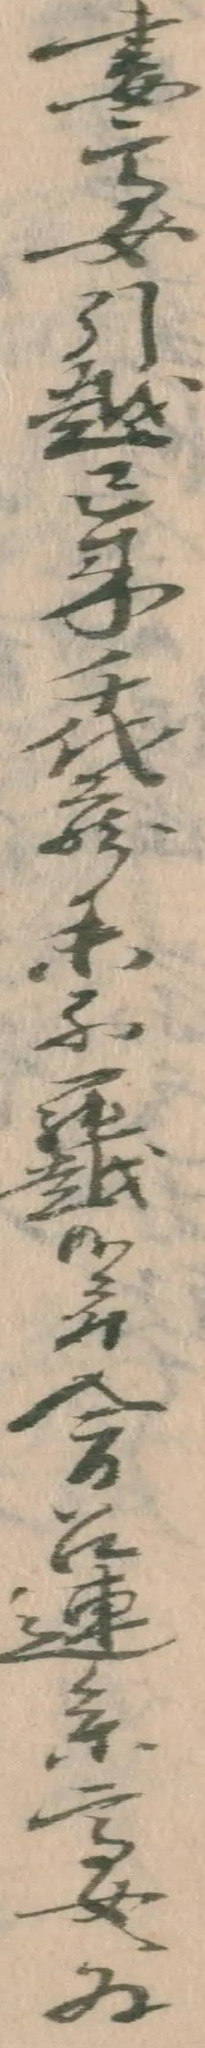妻高女引越已来千代蔵未不罷越候ニ付今日召連参高女へ為
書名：賀茂社記録. 第67冊
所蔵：国立国会図書館 National Diet Library, JAPAN
